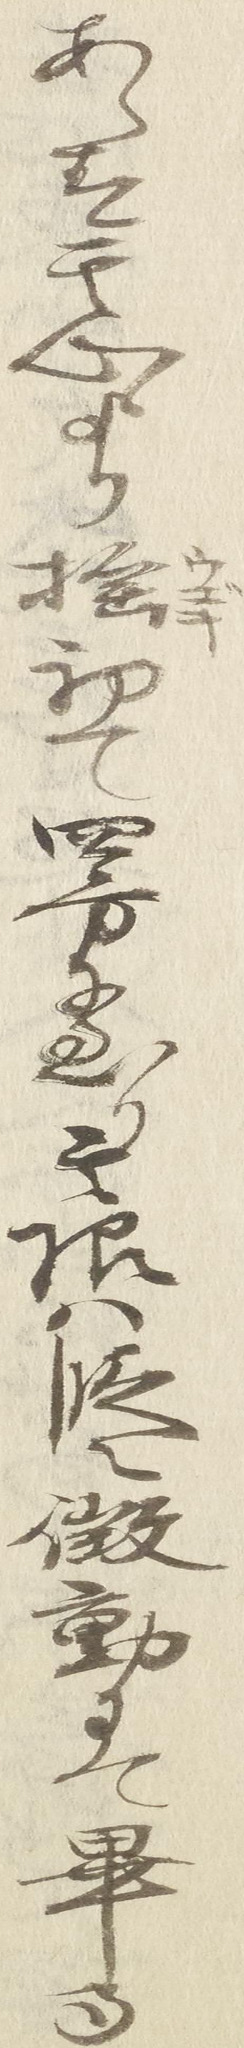あらずす其心より揺初て四方に至り其限は段々微動にて畢る
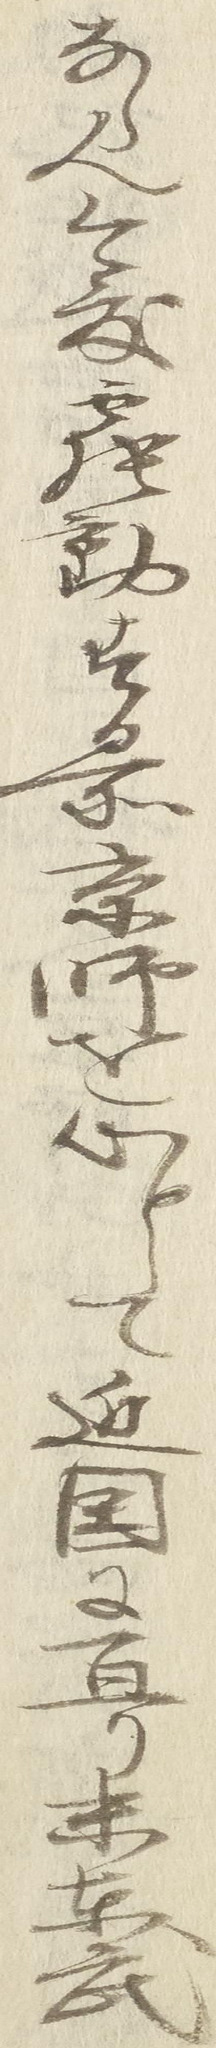ならん今度動する所京師を心として近国に亘り末東武

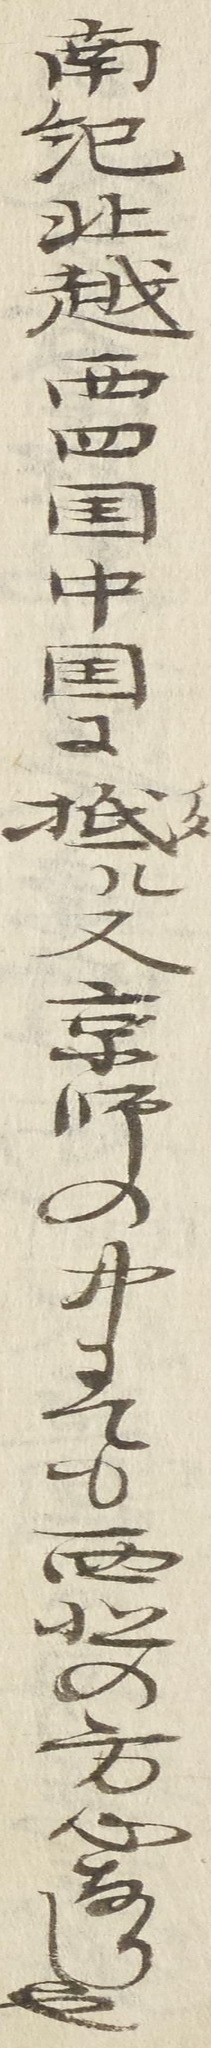南紀北越西四国中国に抵る又京師の中にても西北の方心なりしや
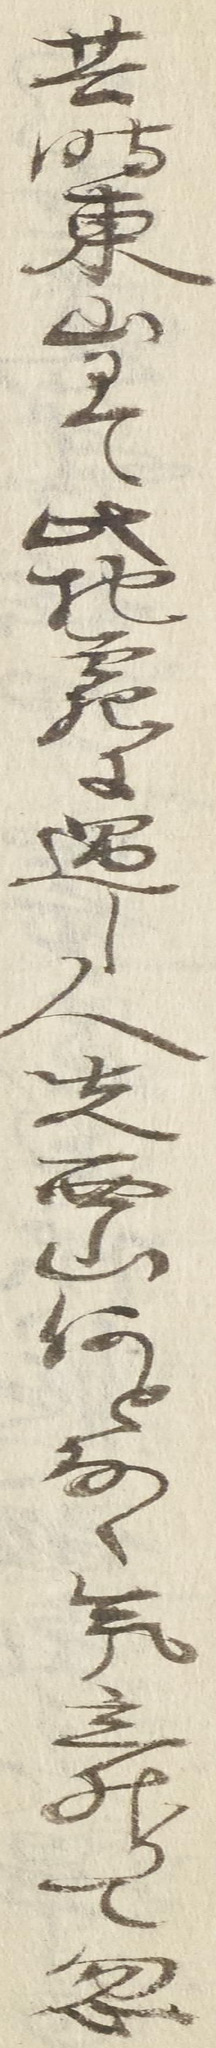其時東山にて此地震に遇し人まづ西山何となく気立升りて忽
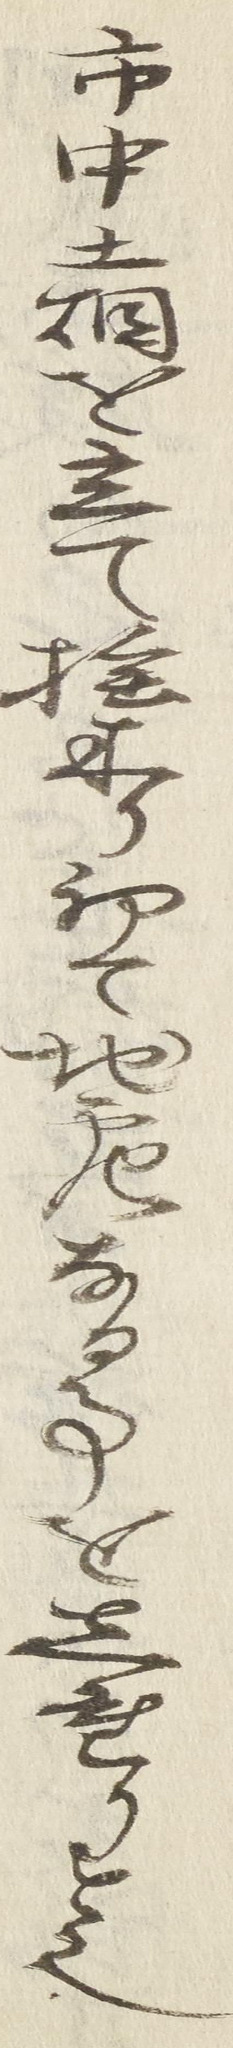市中土烟をたてゝ揺来り初て地震なる事を知れりと也
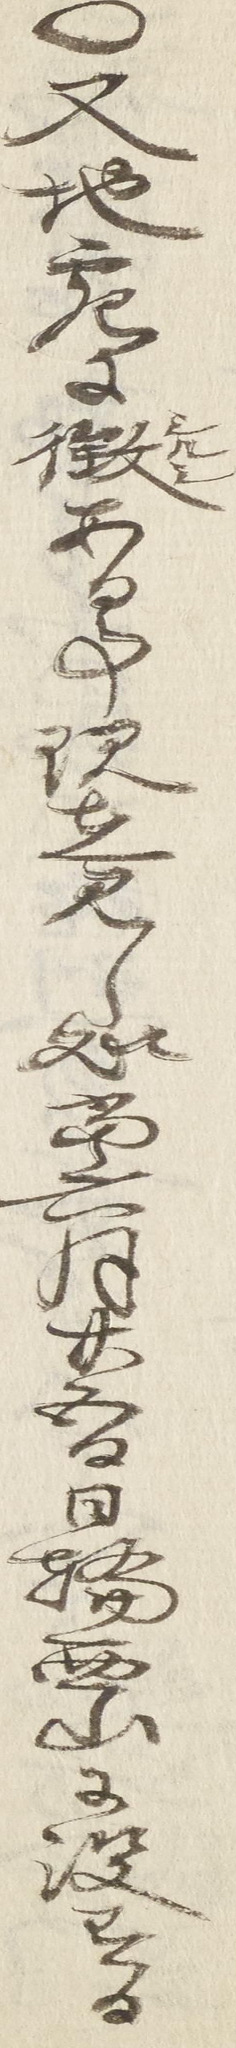○又地震に徴ある事現在見し処当六月廿五日日輪西山に没する
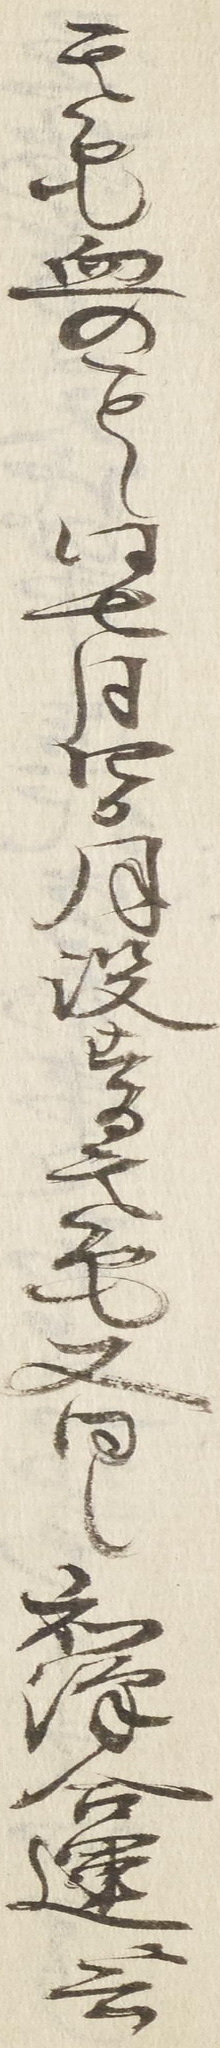其色血のごとし同七月四日月没する其色又同じ和漢合運に云
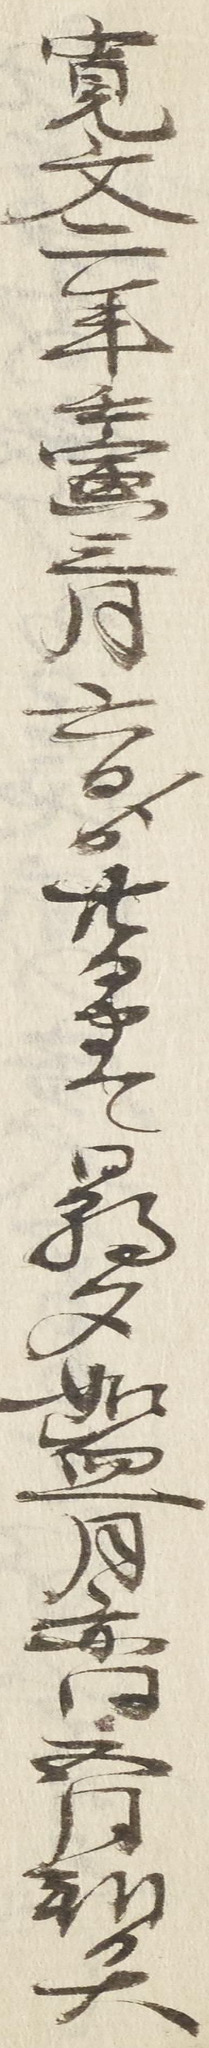寛文二年壬寅三月六日ゟ廿日まで日朝夕如血月亦同五月朔日大
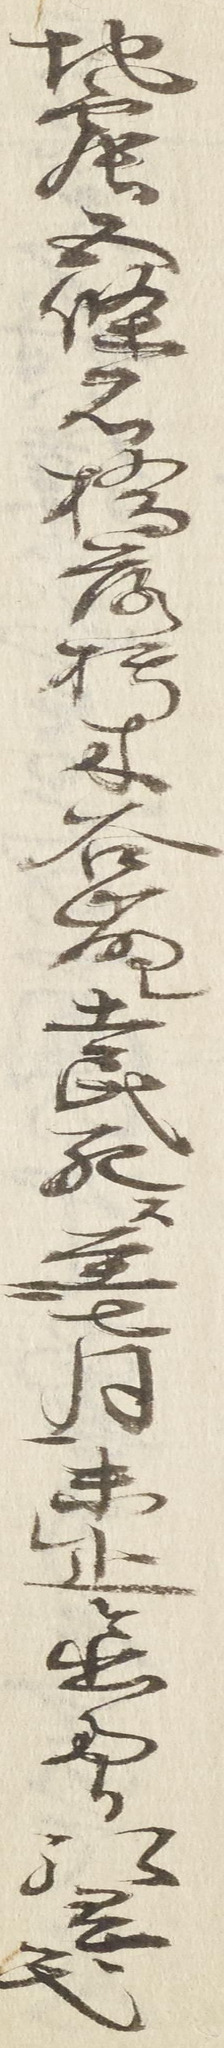地震五條石橋落朽木-谷崩れ土民死す至七月未止出たり弘岡氏
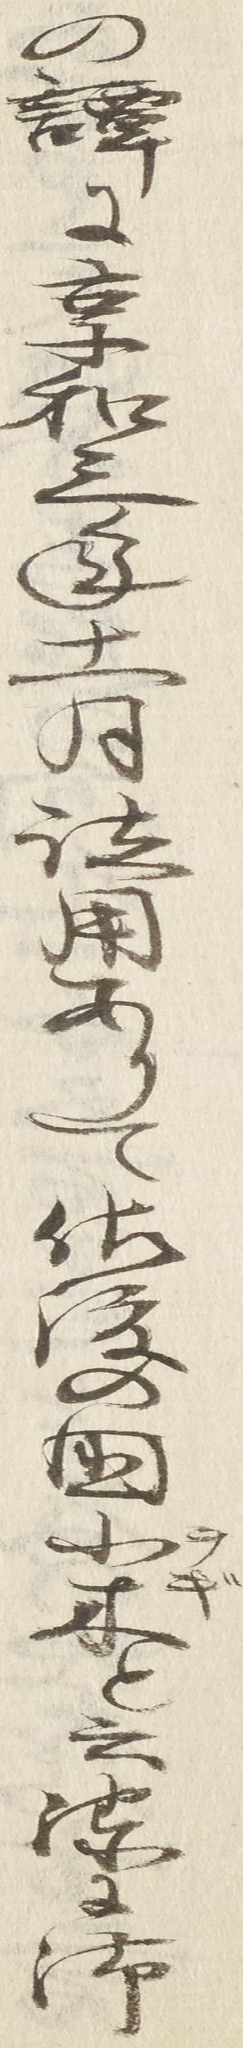の譚に享和三年十一月諸用ありて佐渡の国小木といふ湊に滞
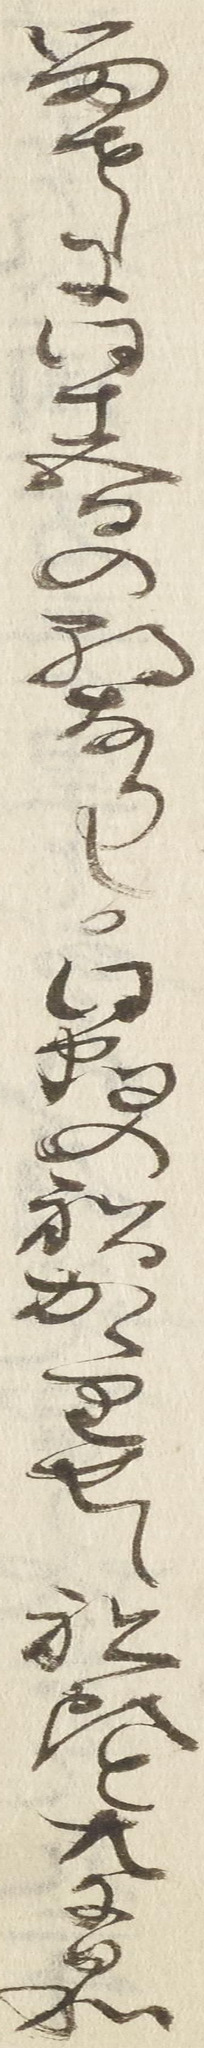留せしに同十五日の朝なりしか同宿の船かゝりせし船頭と共に日和
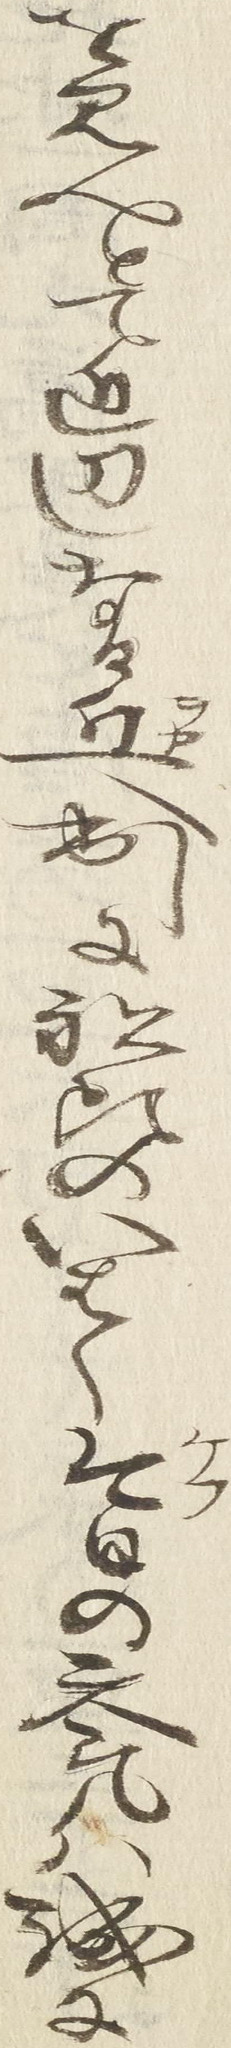を見むとて近辺なる丘へ出しに船頭のいはく今日の天気は誠に
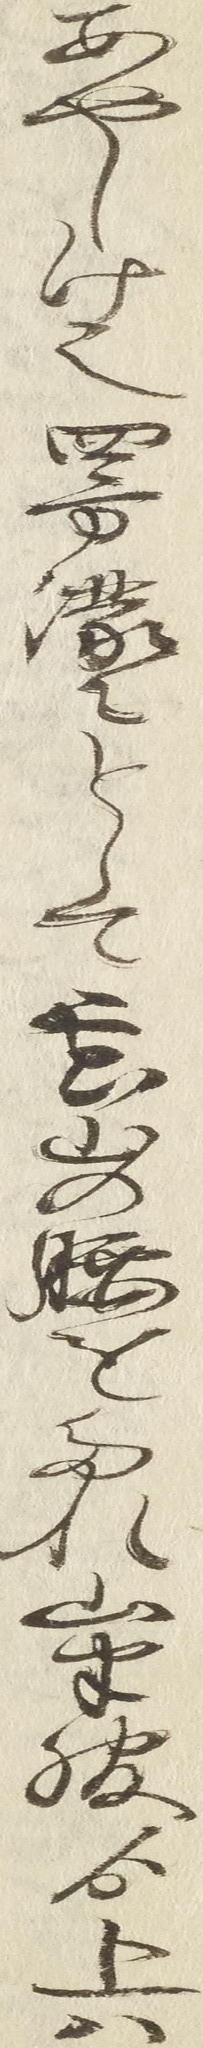あやしげ也四方濛々として雲山の腰をたれ山半腹より上は
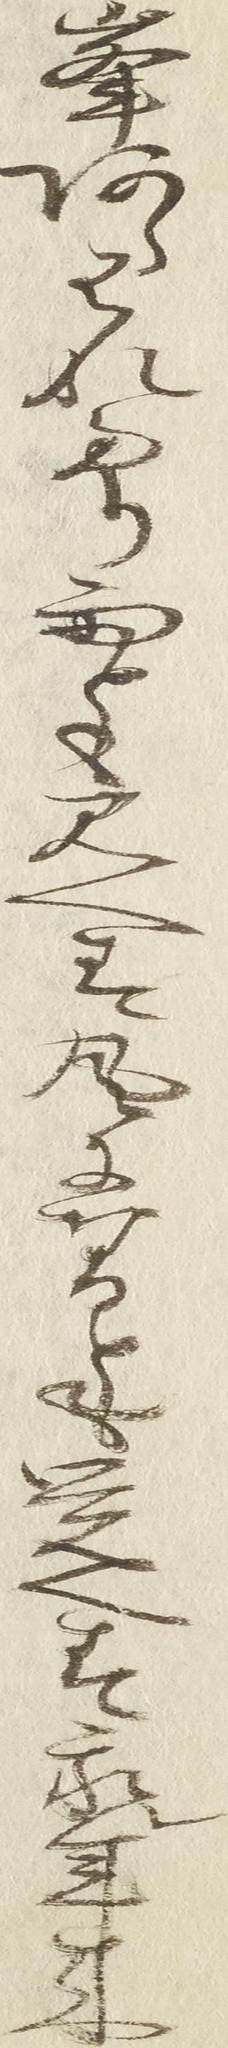峰あらはれたり雨とも見へず風になるとも覚へず我れ年来
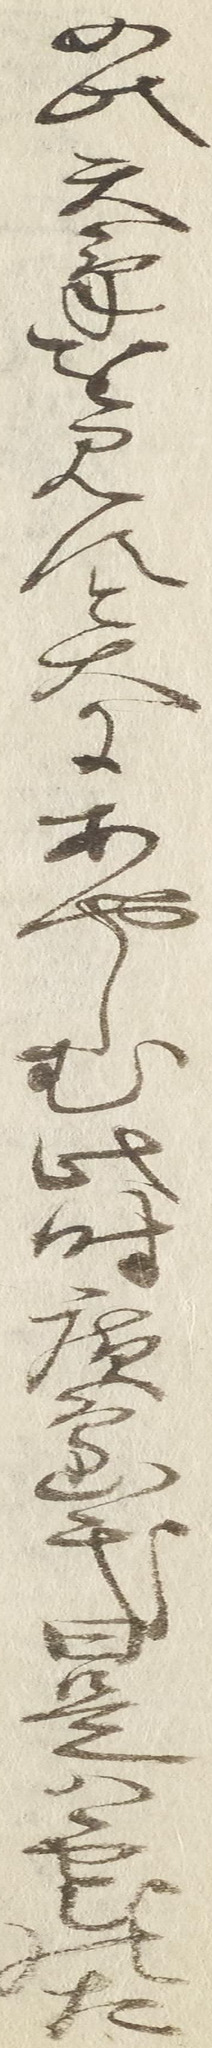如此天気を見すと大にあやしむ此時廣島氏曰是は雲のた
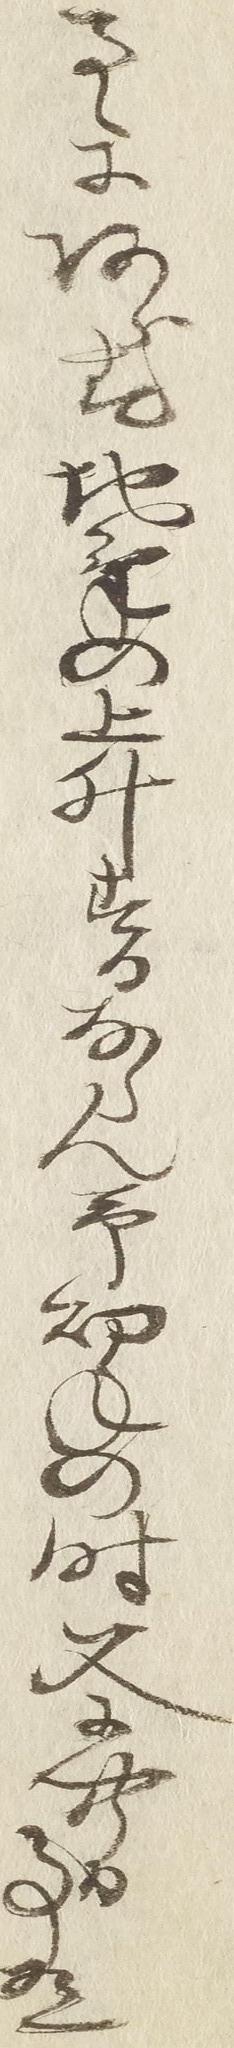ちしにあらす地気の上升するならん予幼年のとき父に聞る事有
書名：地震記　下
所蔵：東京大学地震研究所図書室 Earthquake Research Institute Library, The University of Tokyo, JAPAN
